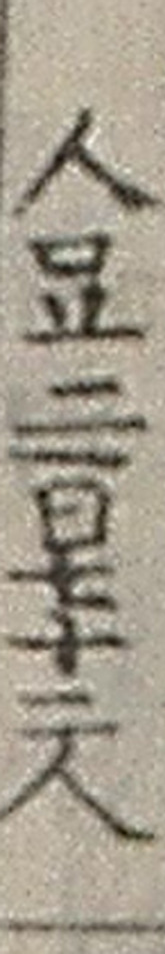人足五百九十二人
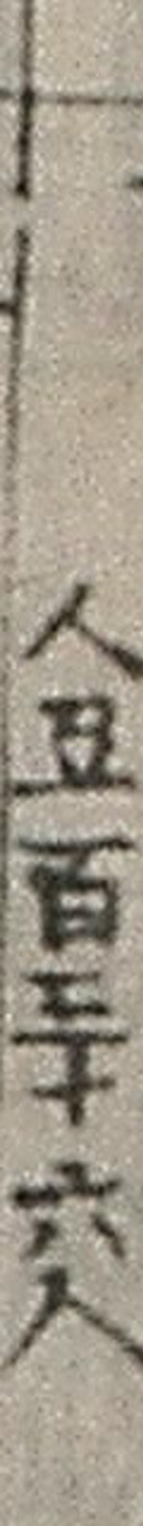人足百三十二人
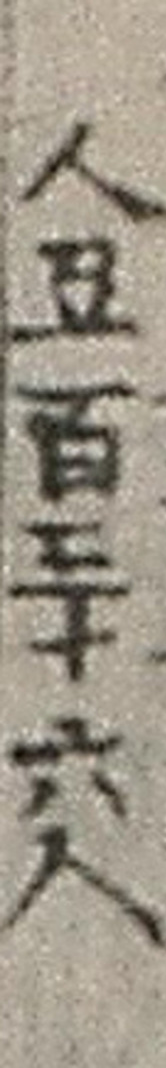人足百三十二人
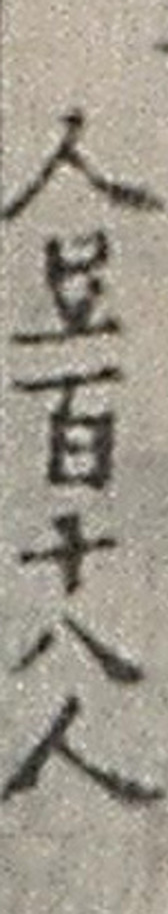人足四十八人
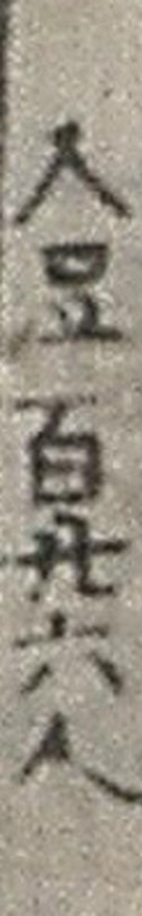人足二百廿六人
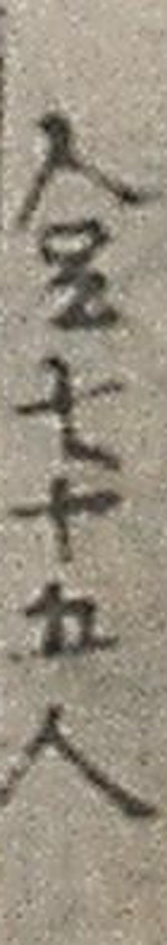人足六十五人
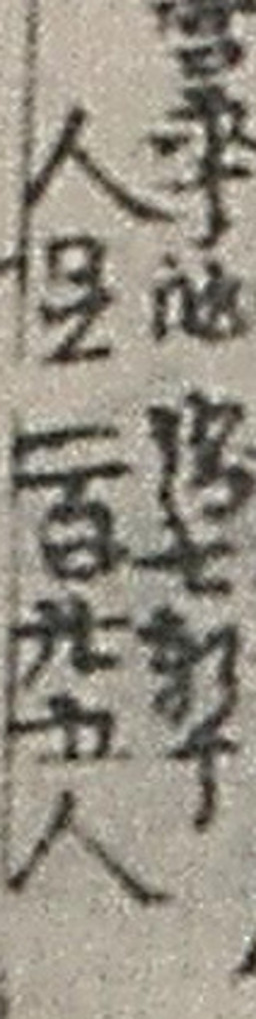人足二百廿六人
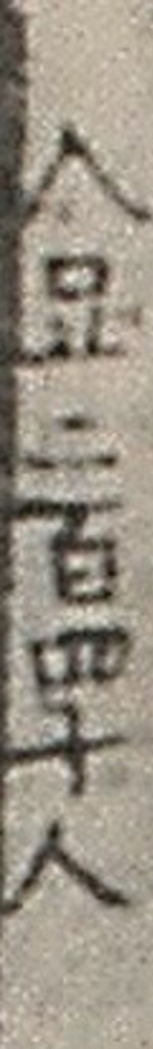人足二百四十九人
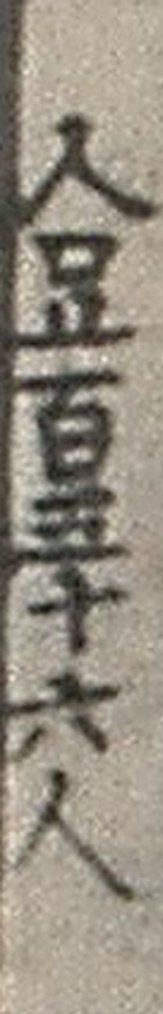人足百五十九人
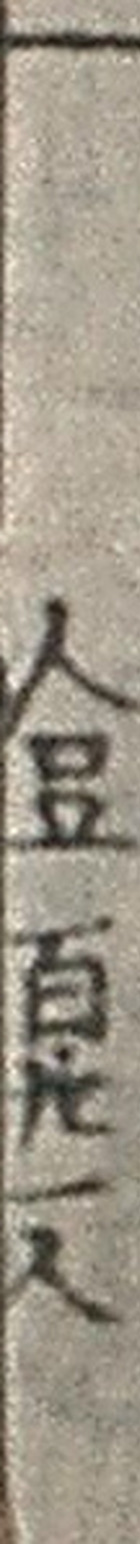人足百廿四人
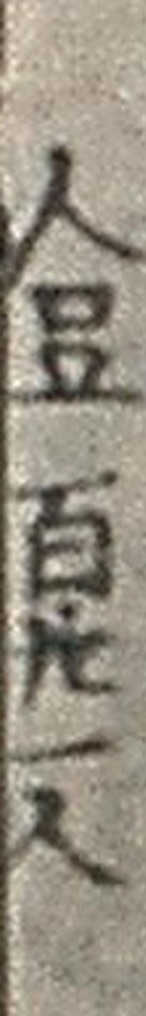人足百廿四人
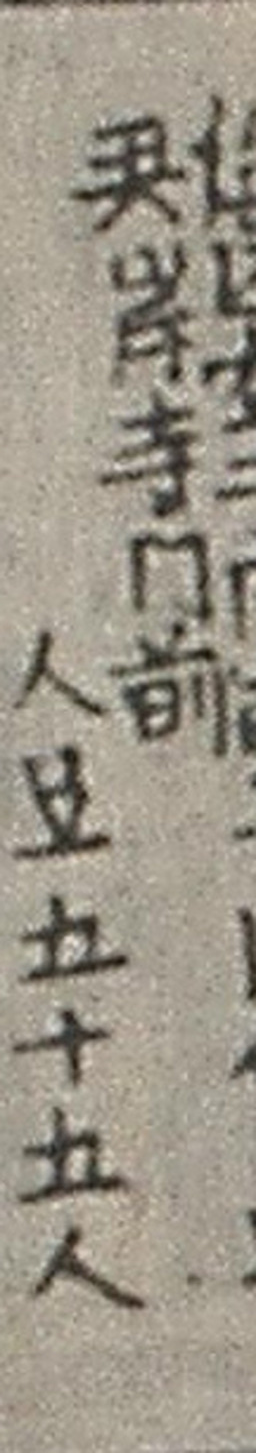人足六十五人
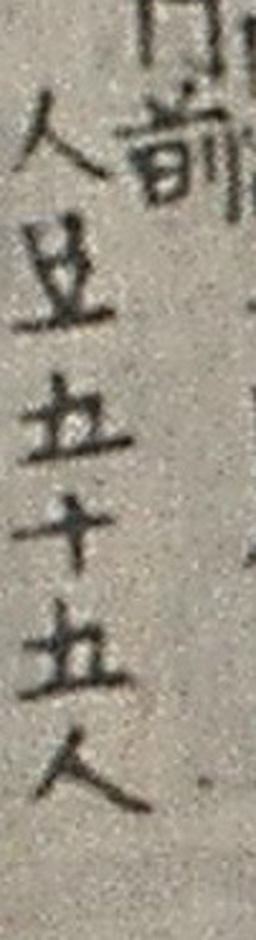人足六十五人
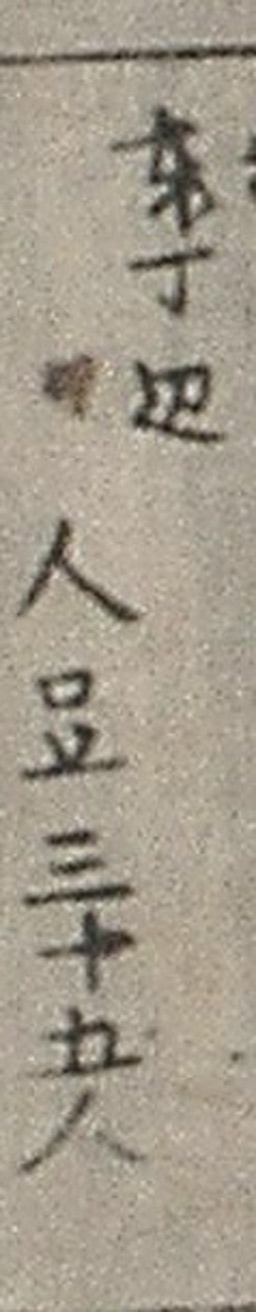人足三十五人
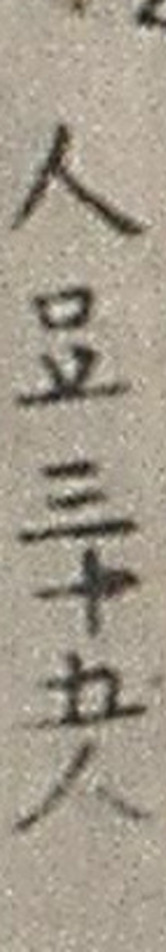人足三十五人
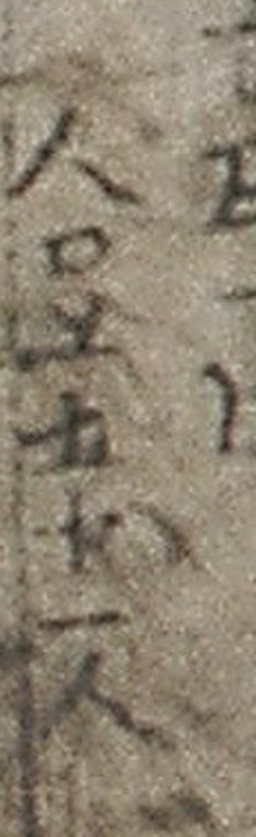人足百十一人
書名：嘉永三戌年二月五日　焼場方角案内記
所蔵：東京大学地震研究所図書室 Earthquake Research Institute Library, The University of Tokyo, JAPAN
